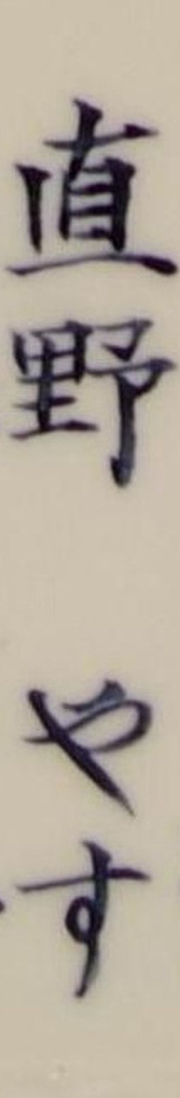直野やす
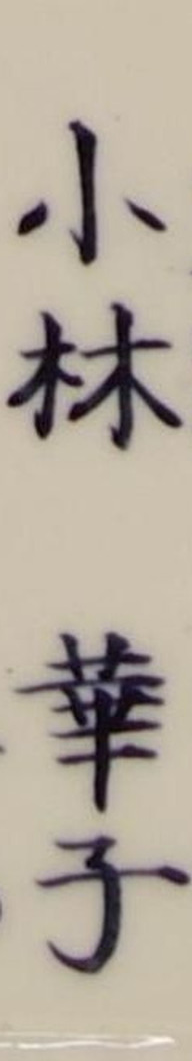小林華子
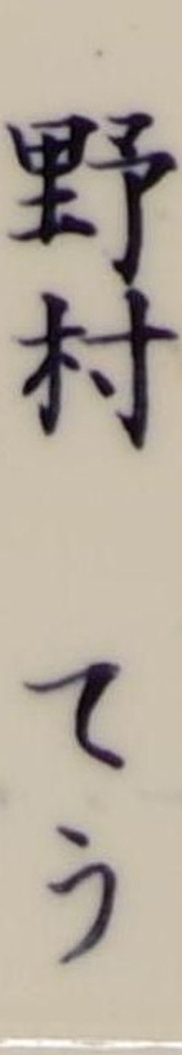野村てう
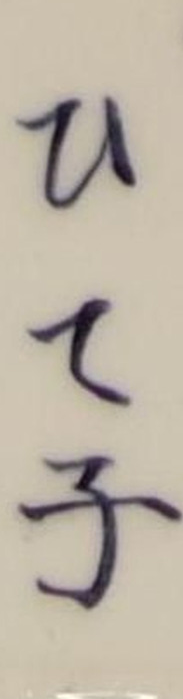ひて子
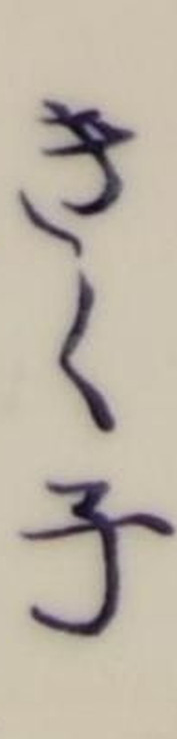きく子
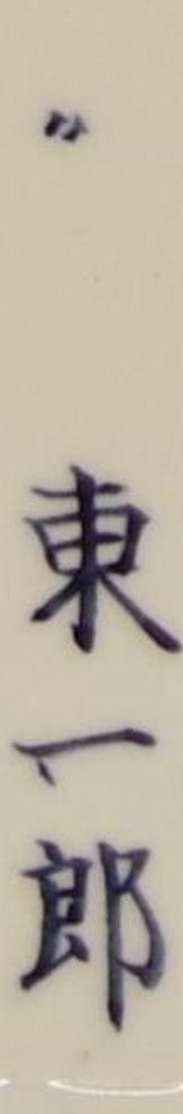東一郎
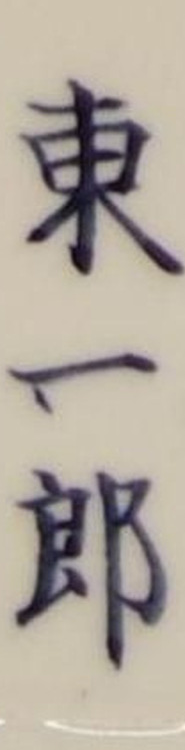東一郎
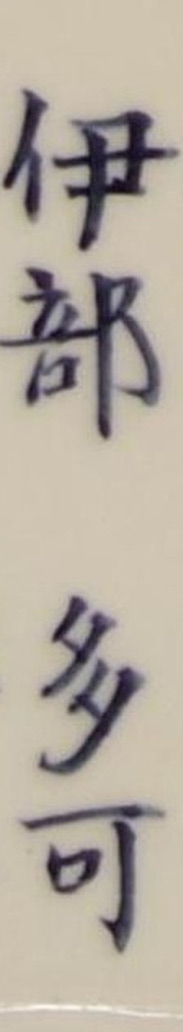伊部多可
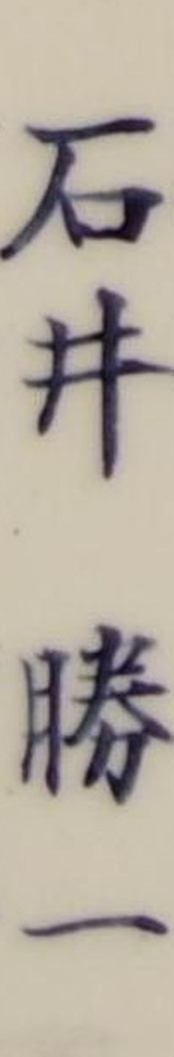石井勝一
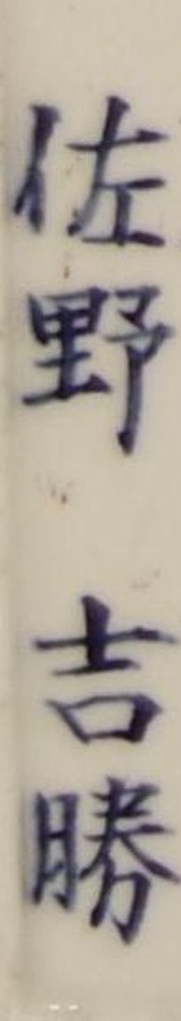佐野吉勝

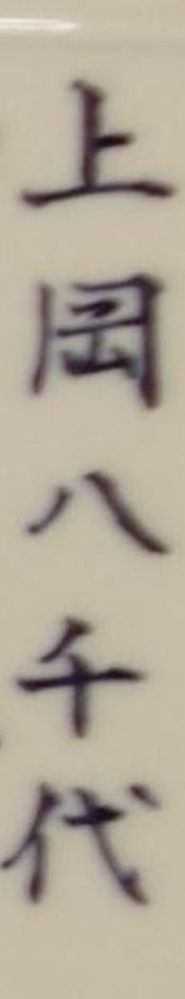上岡八千代
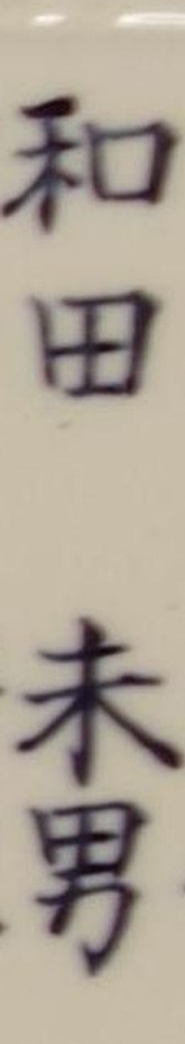和田未男
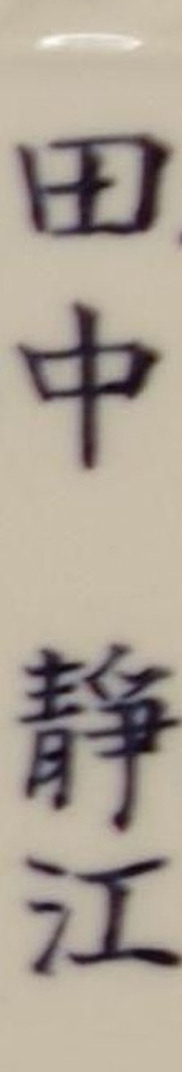田中静江
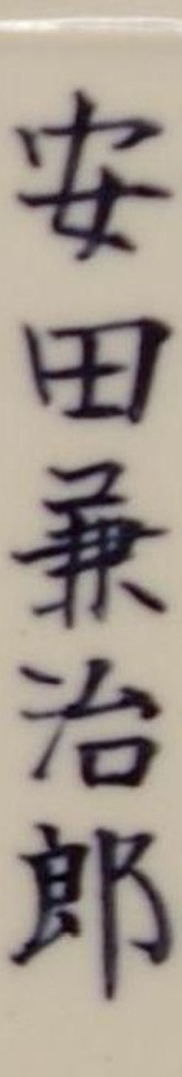安田兼治郎
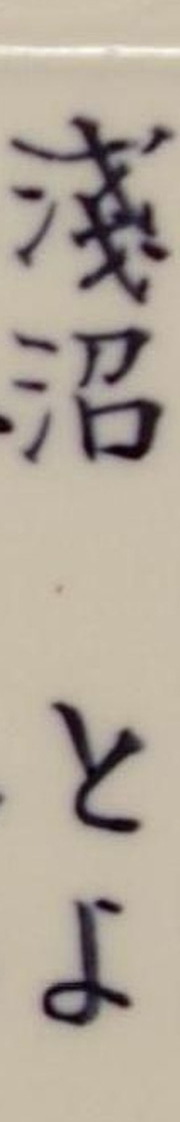浅沼とよ
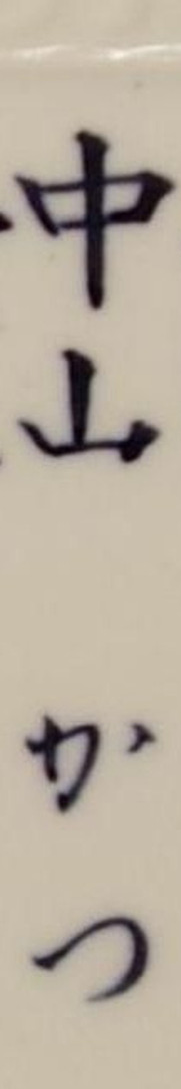中山かつ
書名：M~S
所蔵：高野山金剛峯寺
